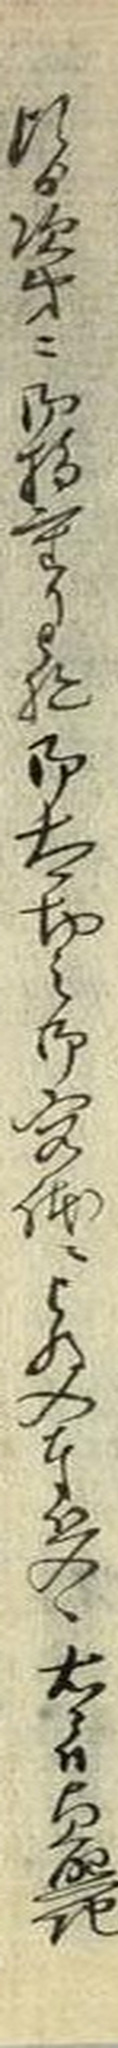頃ゟ次第ニ御指重り被遊御太切之御容体ニ被為入奉恐入候右ニ付貞照院
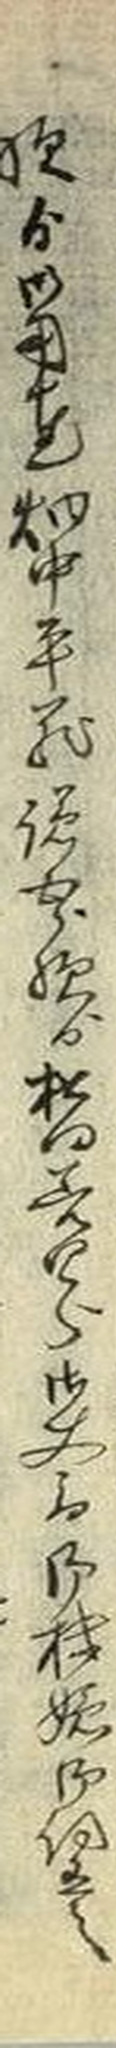様ゟ御用達畑中平蔵謙五郎様ゟ松田善四郎御使ニ而御機嫌御伺有之
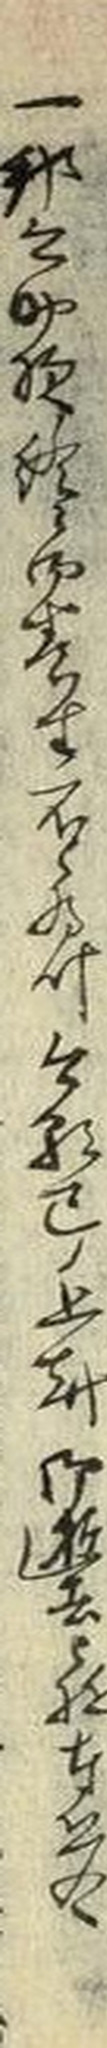一邦之助様終ニ御養生不被為叶今朝巳ノ上刻御逝去被遊奉恐入候
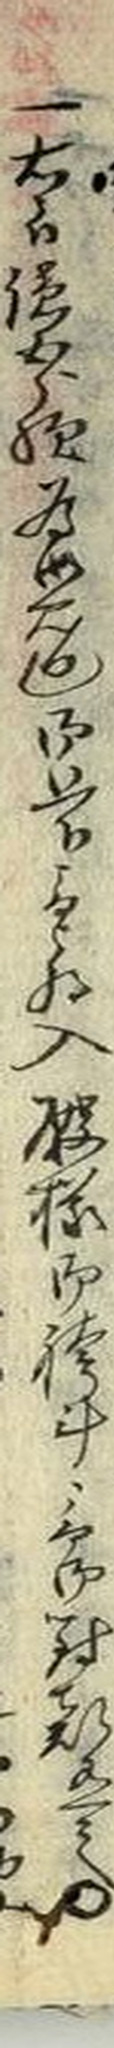一右ニ付謙五郎様為御見廻御上下ニ而被為入殿様御袴斗ニ而御対顔有之〇
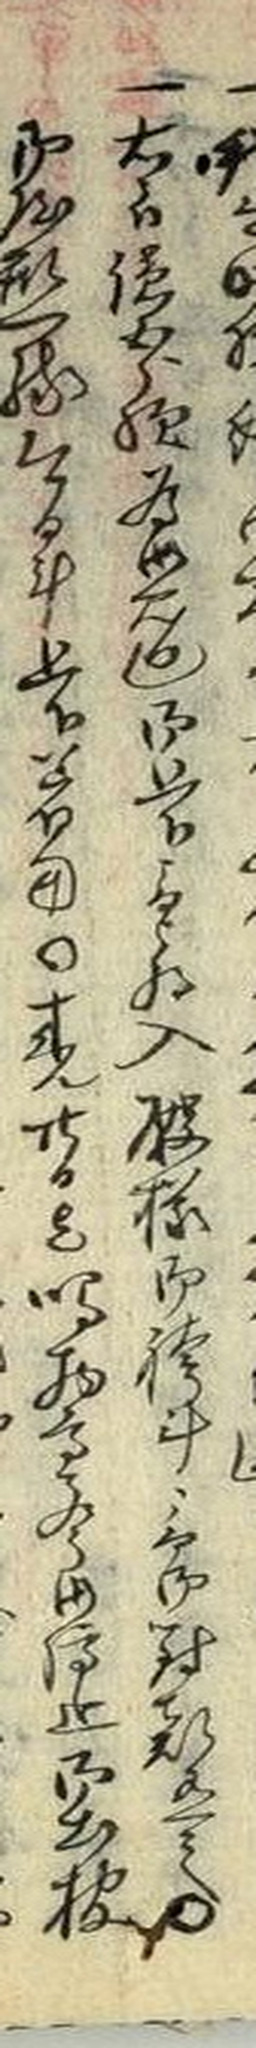御屋形一統今日斗上下着用〇来ル廿日迄鳴物高声御停止御出棺
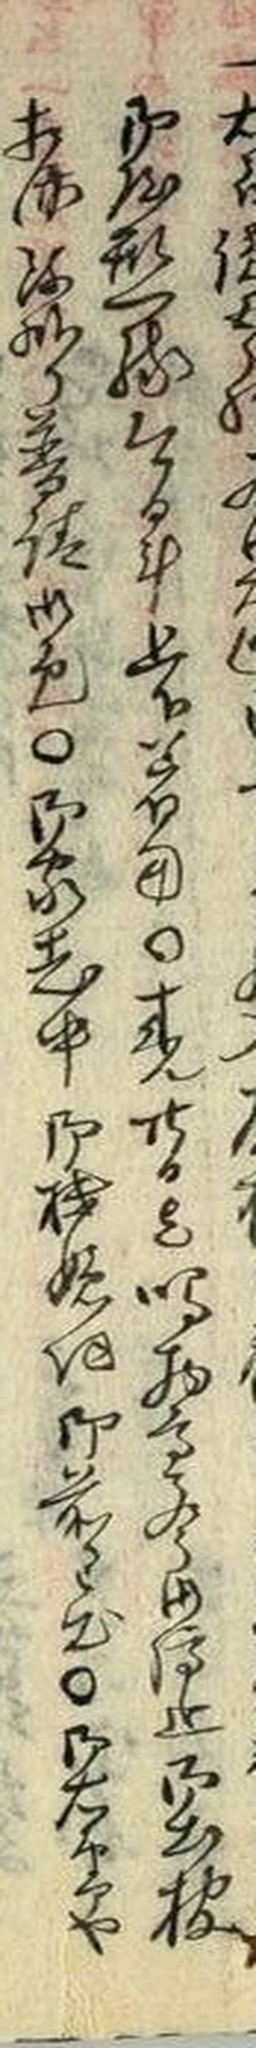相済致掛り普請御免〇御家老中御機嫌伺御前へ被出〇御右筆部や
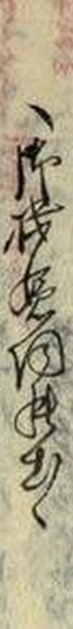へ御機嫌伺罷出候
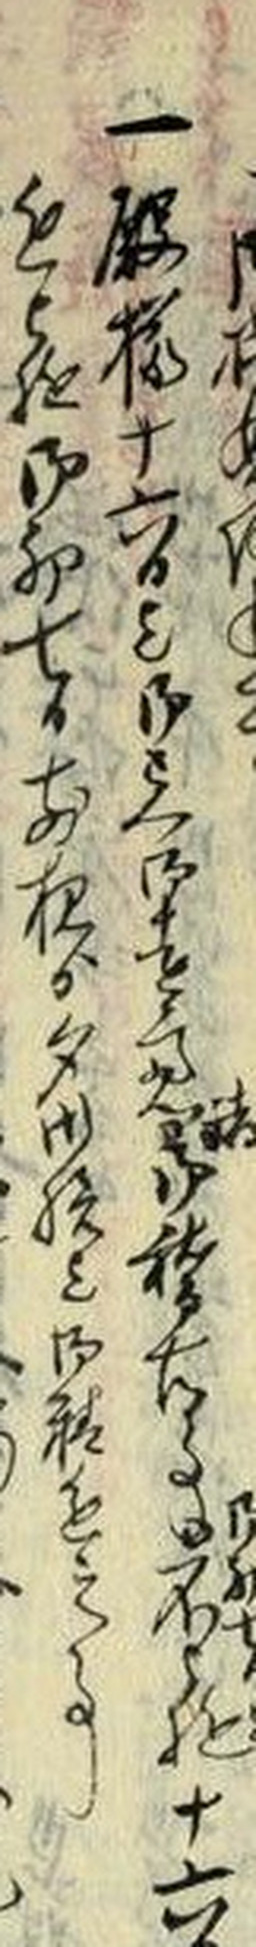進被遊御初七日前夜ゟ夕御膳迄御精進之事
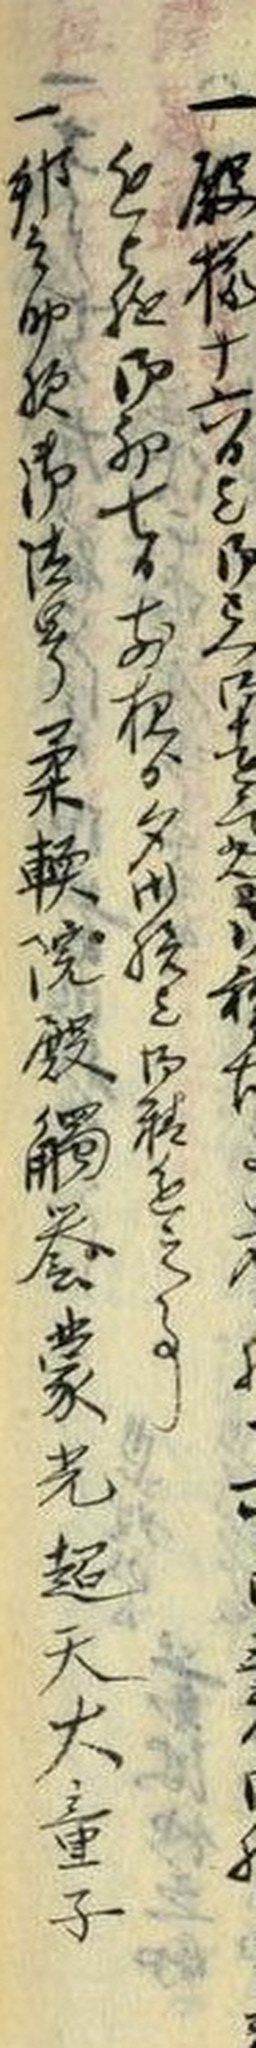一邦之助様御法号柔輭院殿触誉蒙光超天大童子
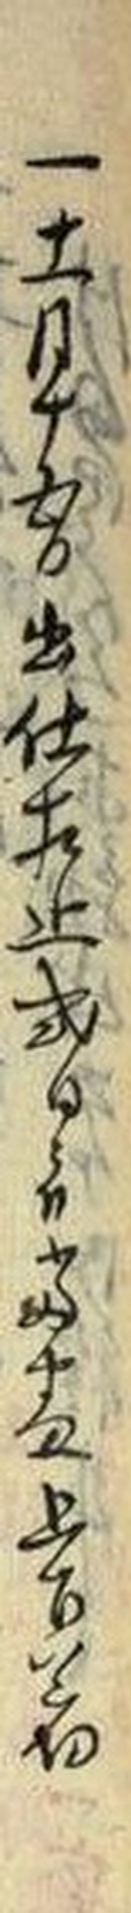一十一月十五日出仕相止式日ニ付当番上下着
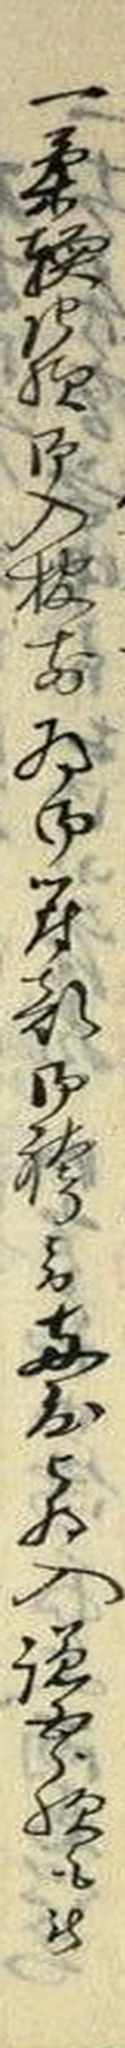一柔輭院様御入棺前為御対顔御袴ニ而両度被為入謙五郎様も被
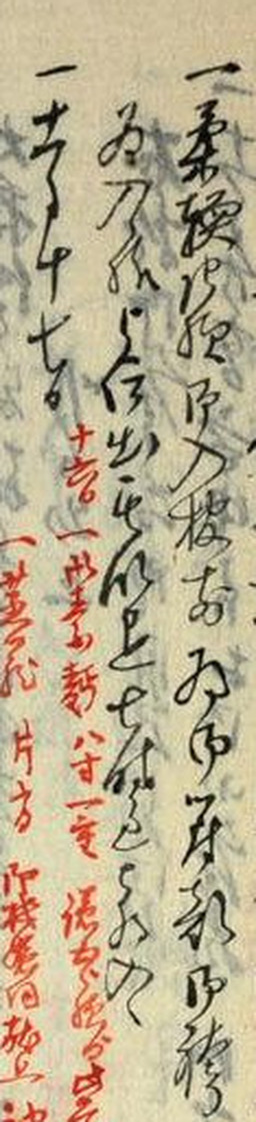為入候様被仰出其段申上七時過被為入候
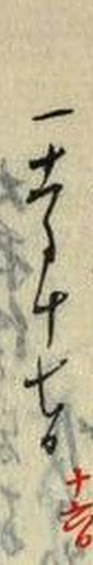一十一月十七日
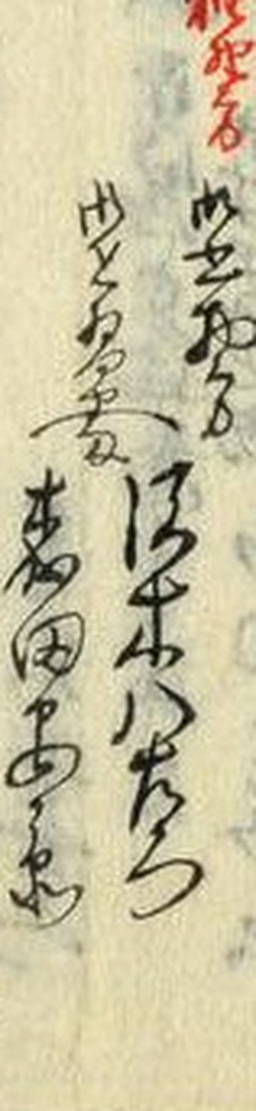御近習番森田安兵衛
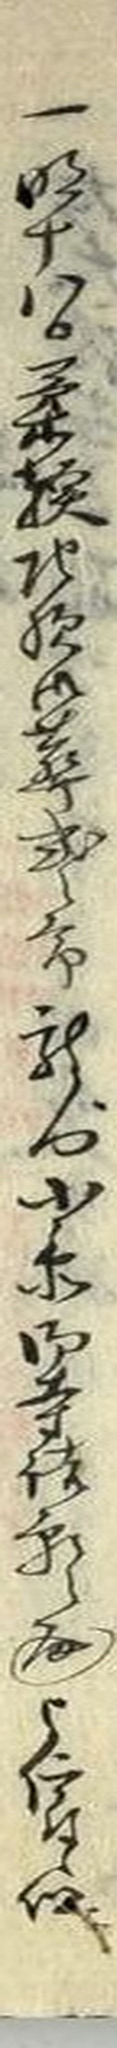一明十八日柔輭院様御葬式之節新右衛門小兵衛御寺詰願之通被仰付候但
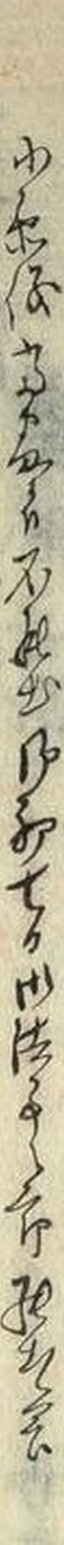小兵衛儀当番ニ付不罷出御初七日御法事之節罷出候筈
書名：少傅日録抄（斉承付側向頭取日記、在国）
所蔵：福井県文書館 Fukui Prefectural Archives
